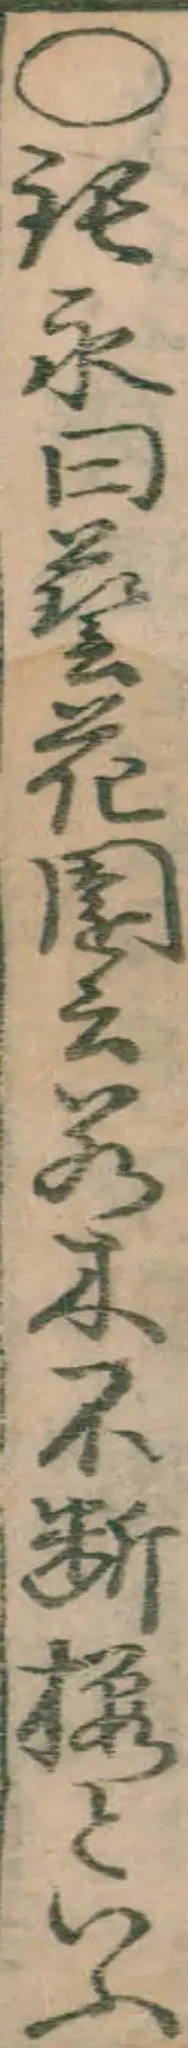○鈍永曰芸花園云若木不断桜といふ

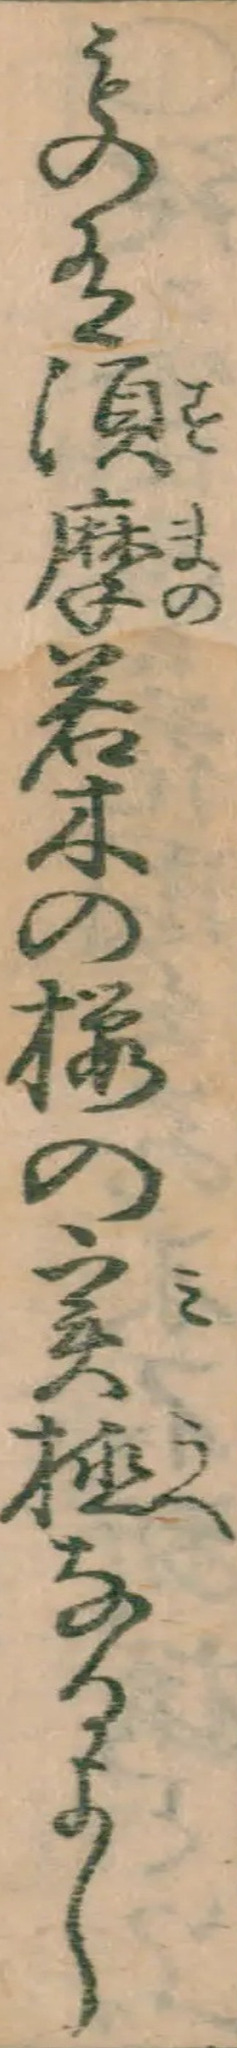もの有須磨若木の桜の実植なるよし
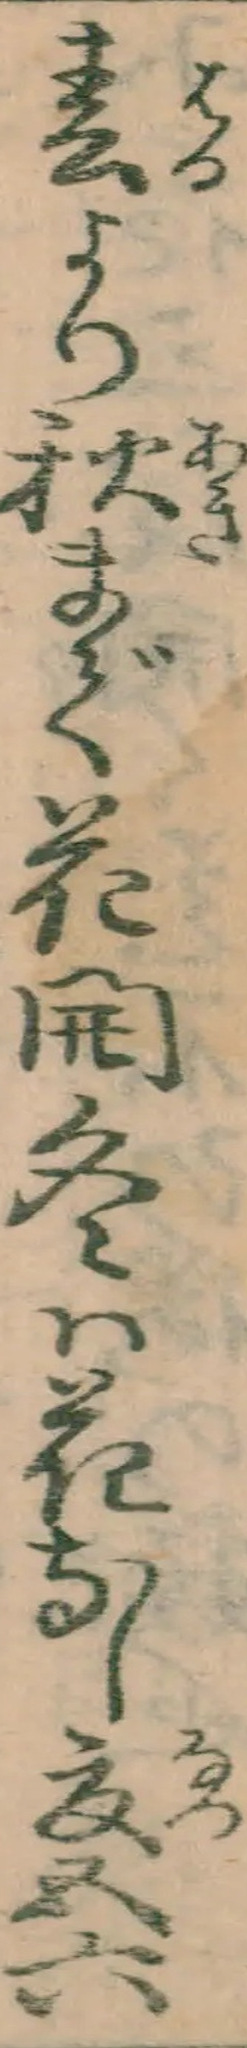春より秋まで花開冬は花なし夏五六
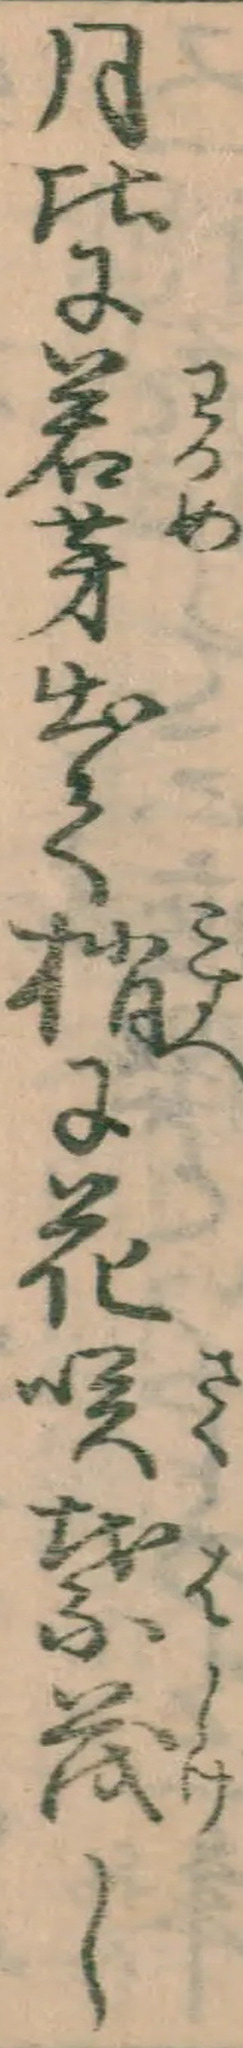月比に若芽出て梢に花咲葉茂し
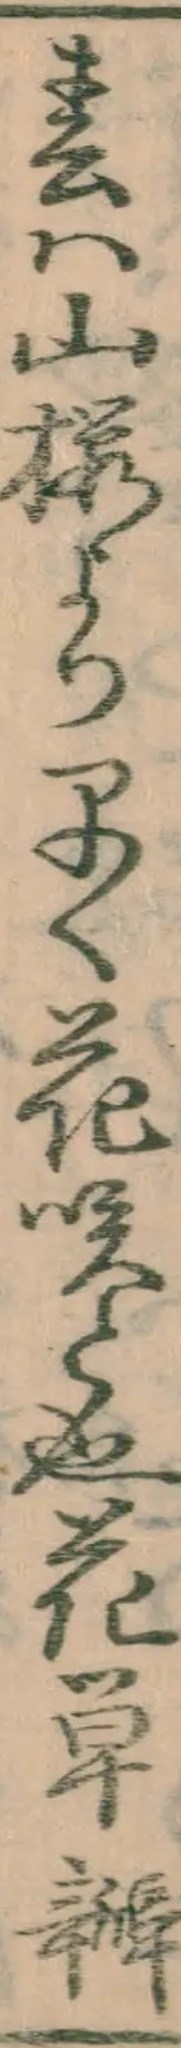春は山桜より早く花咲と也花単弁
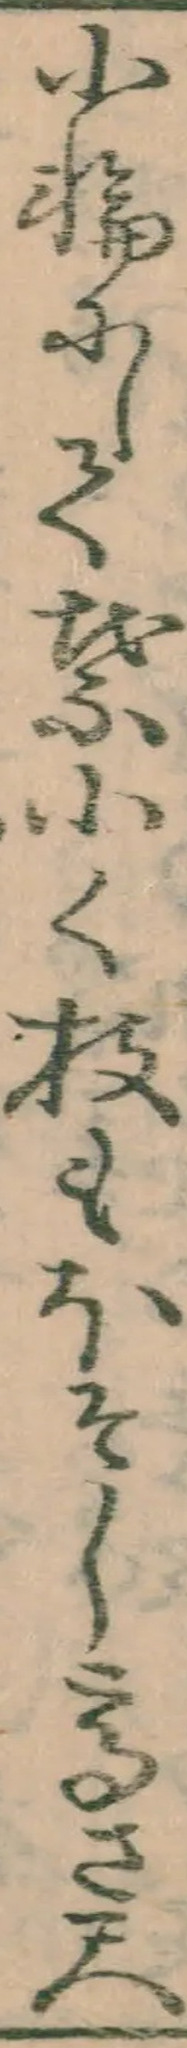小輪にして葉小く枝もほそし高さ尺
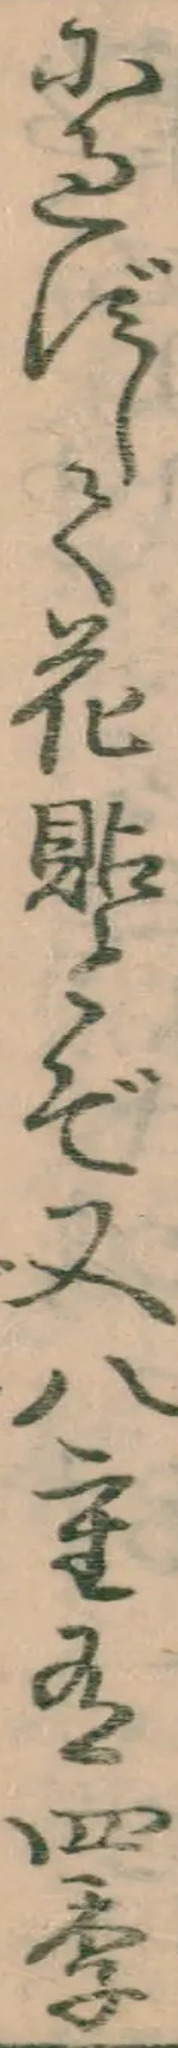に過ずして花貼とぞ又八重有四季
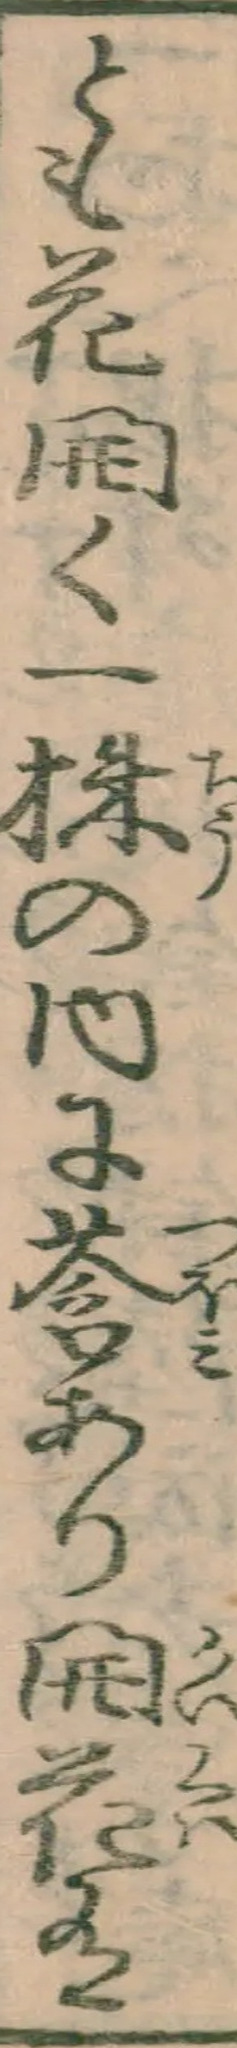とも花開く一株の内に莟あり開花有
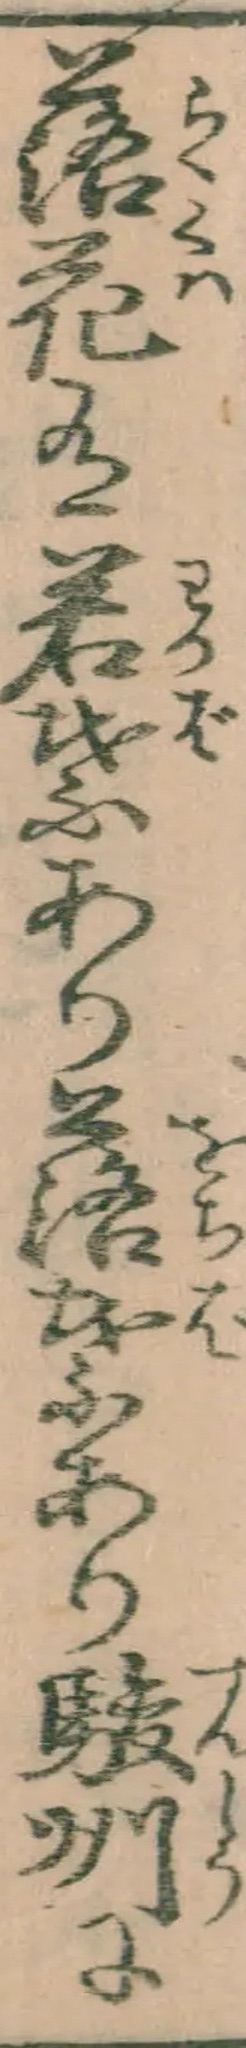落花有若葉あり落葉あり駿州に
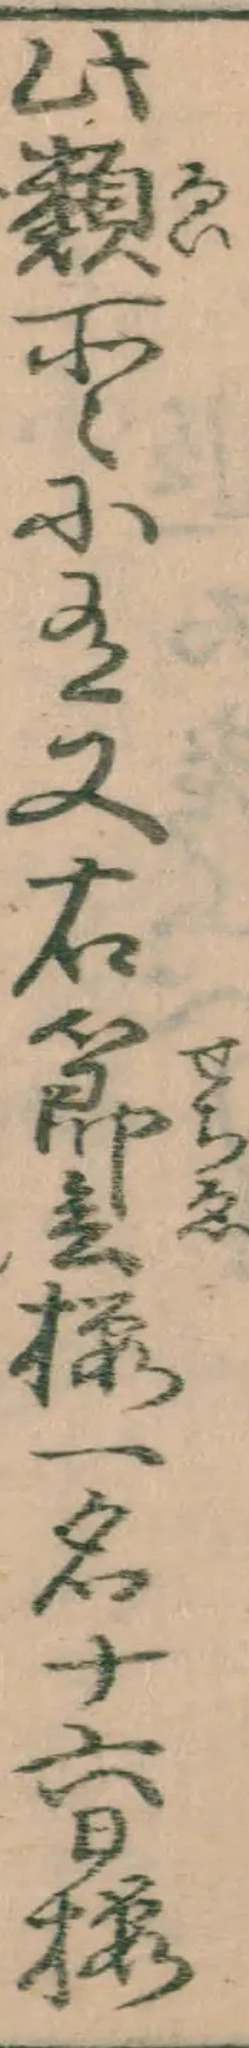此類所々に有又右節会桜一名十六日桜
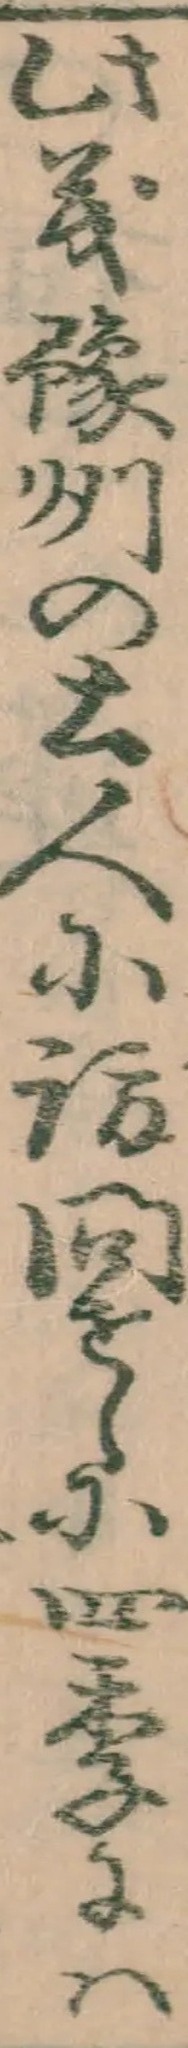此義予州の土人に訪問せしに四季には
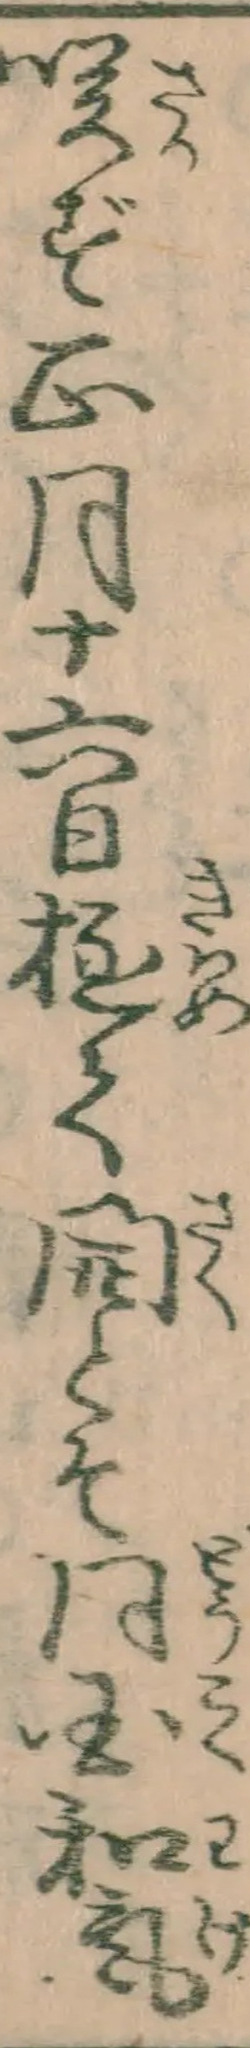咲ず正月十六日極て開とそ同国和気
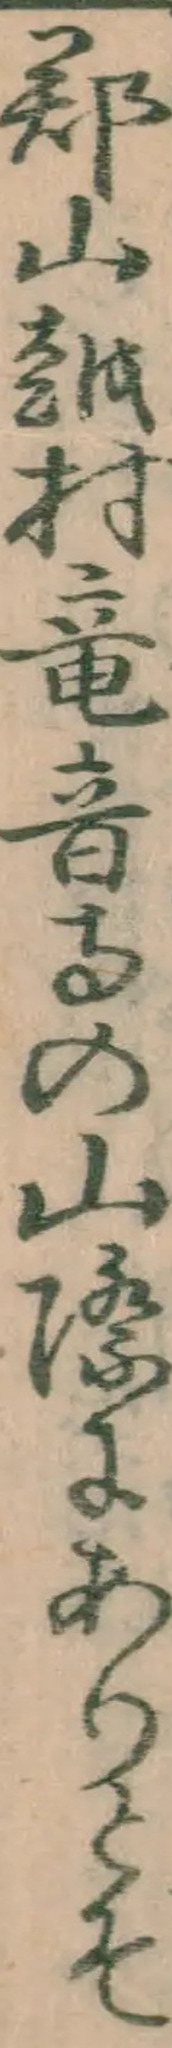郡山越村竜音寺の山際にありとぞ

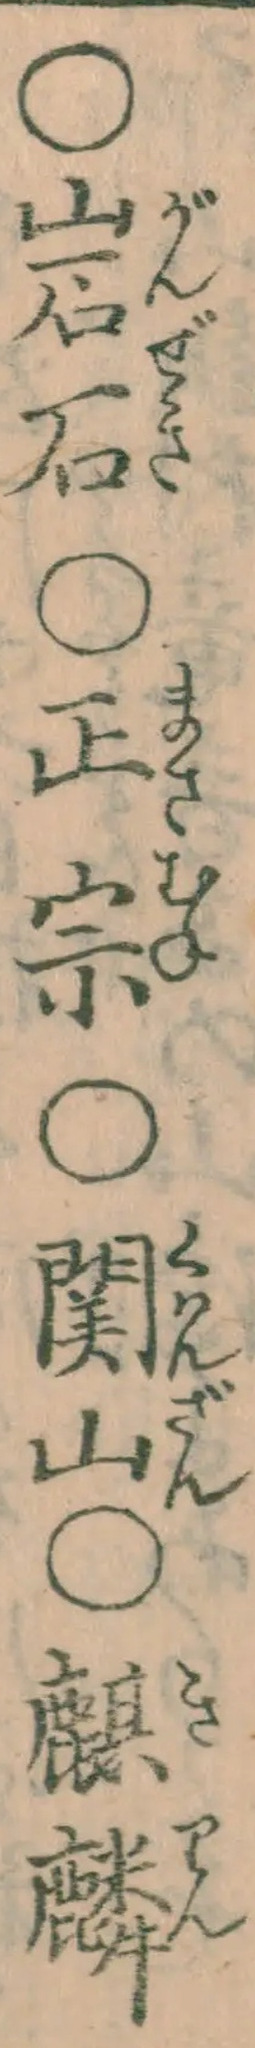○岩石○正宗○関山○麒麟
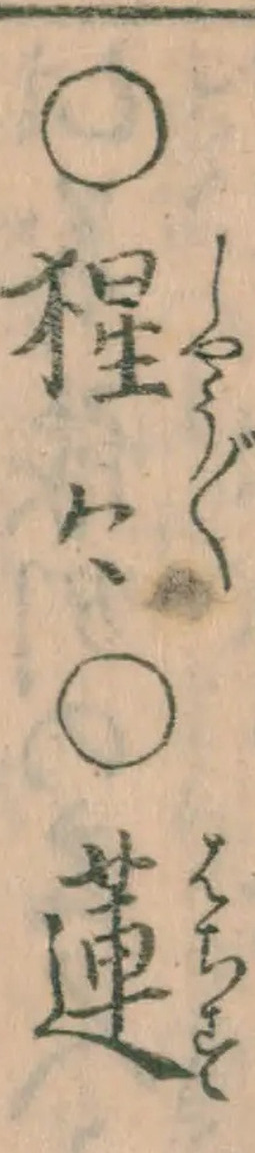○猩々○蓮
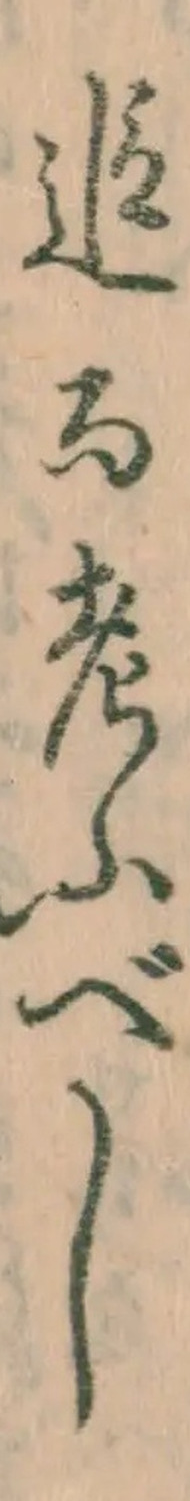追而考ふべし
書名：怡顔齋櫻品
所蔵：国立国会図書館 National Diet Library, JAPAN
